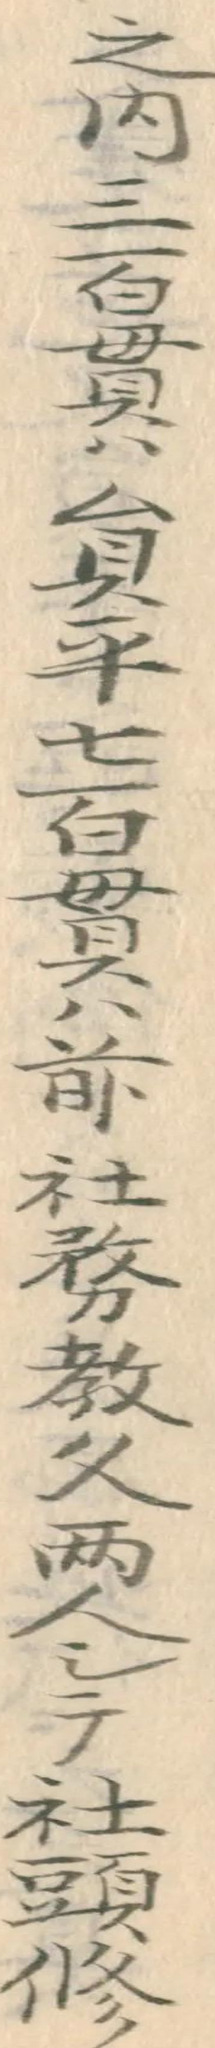之内三百貫ハ員平七百貫ハ前社務教久両人シテ社頭修
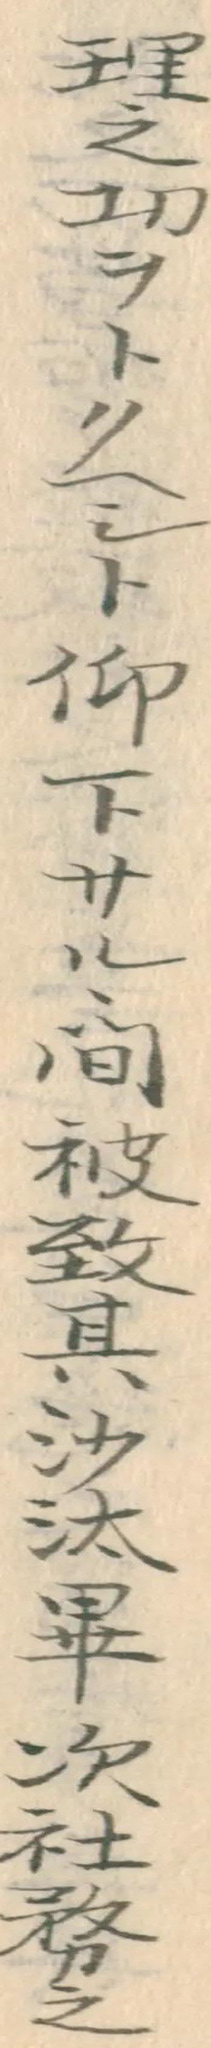理之功ヲトクヘシト仰下サルヽ間被致其沙汰畢次社務之
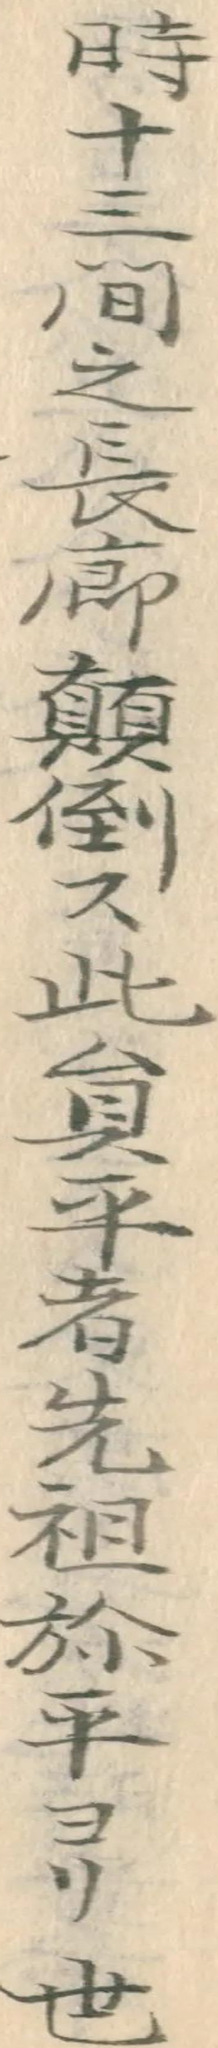時十三間之長廊顛倒ス此員平者先祖於平ヨリ世
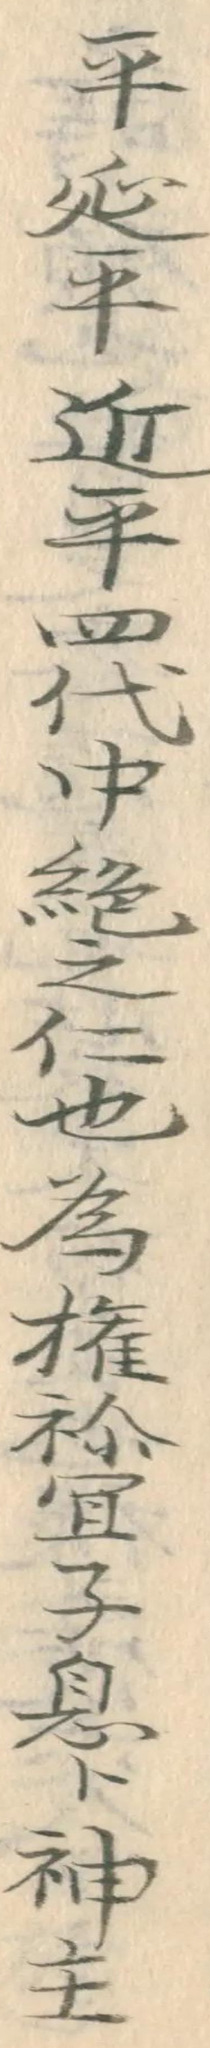平延平近平四代中絶之仁也為権祢宜子息ト神主
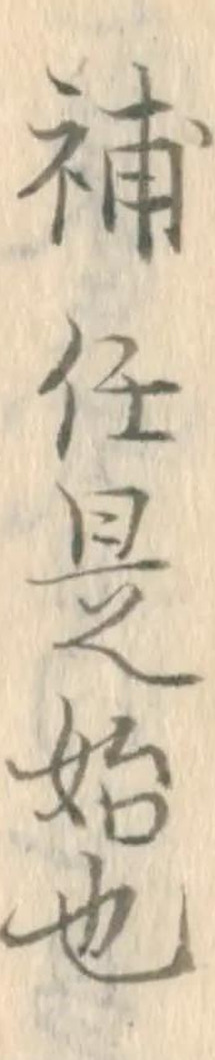補任是始也
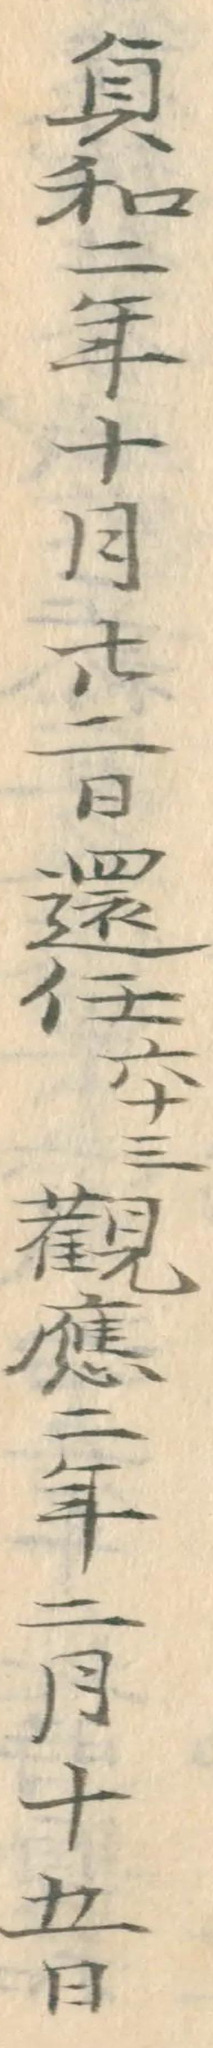貞和二年十月廿二日還任六十三観応二年二月十五日

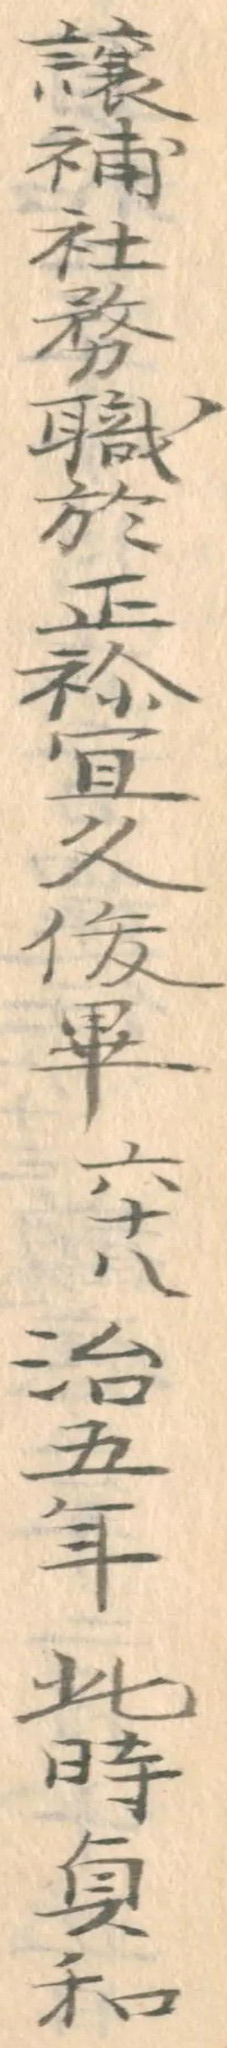譲補社務職於正祢宜久俊畢六十八治五年此時貞和
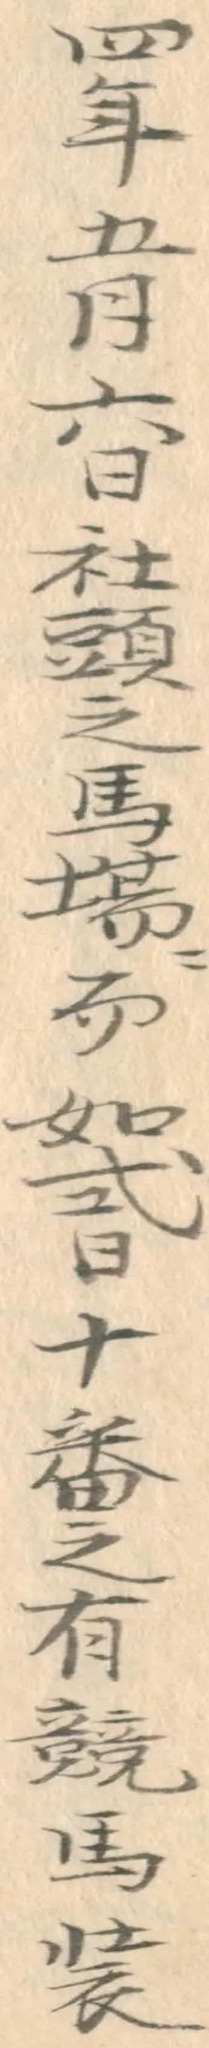四年五月六日社頭之馬場ニ而如式日十番之有競馬装
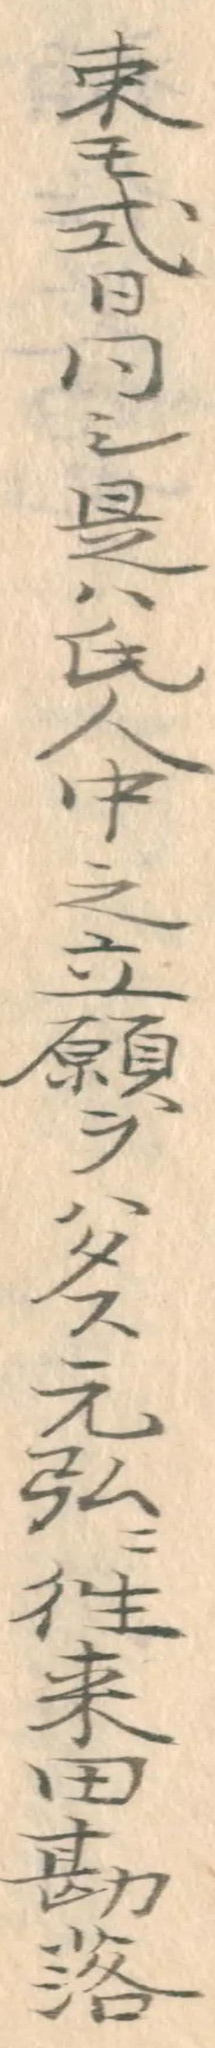束モ式日同シ是ハ氏人中之立願ヲハタス元弘ニ往来田勘落
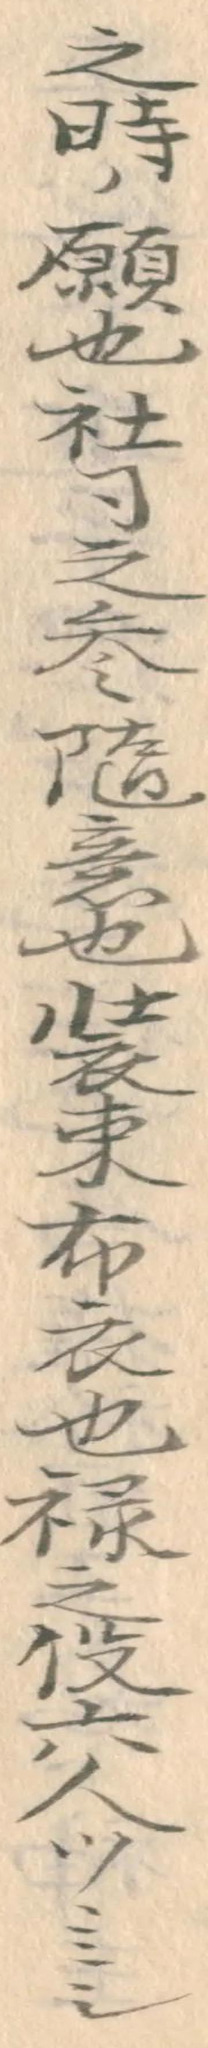之時ノ願也社司之参随意也装束布衣也禄之役六人ツヽミシ
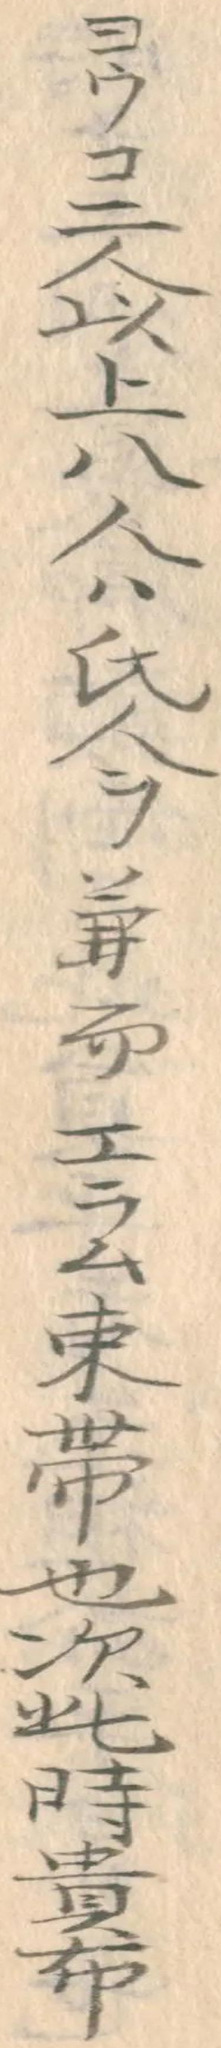ヨウコ二人以上八人ハ氏人ヲ兼而エラム束帯也次此時貴布
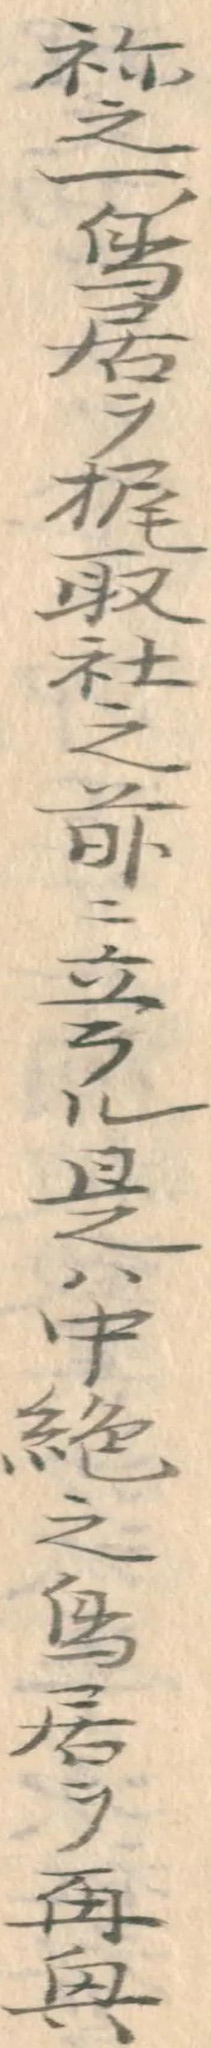祢之一ノ鳥居ヲ梶取社之前ニ立ラル是ハ中絶之鳥居ヲ再興
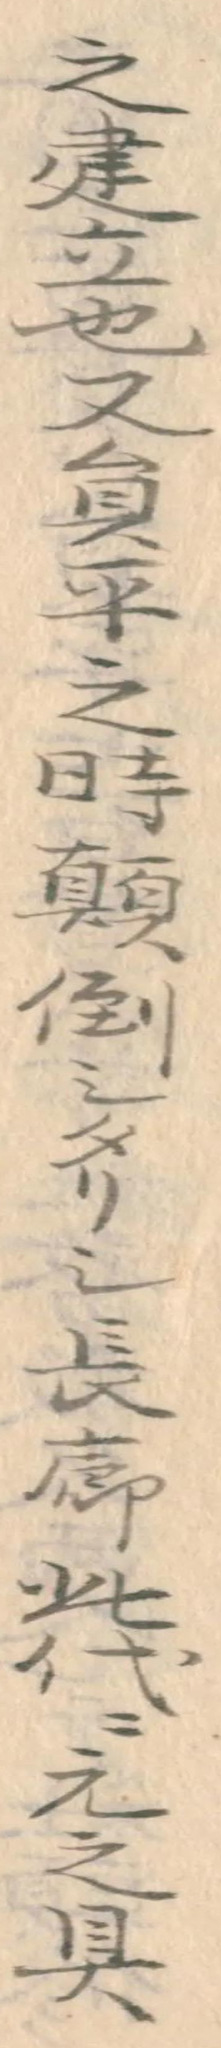之建立也又員平之時顛倒シタリシ長廊此代ニ元之具
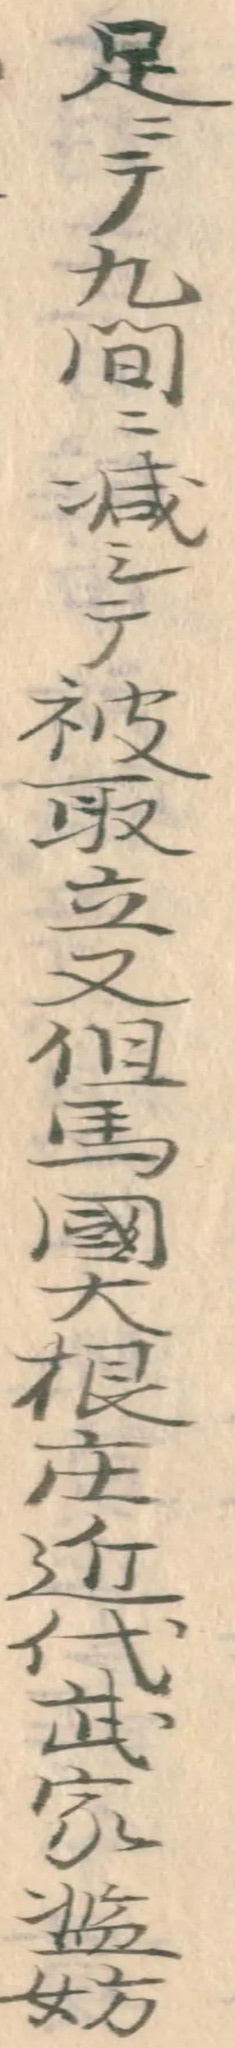足ニテ九間ニ減シテ被取立又但馬国大根庄近代武家監妨
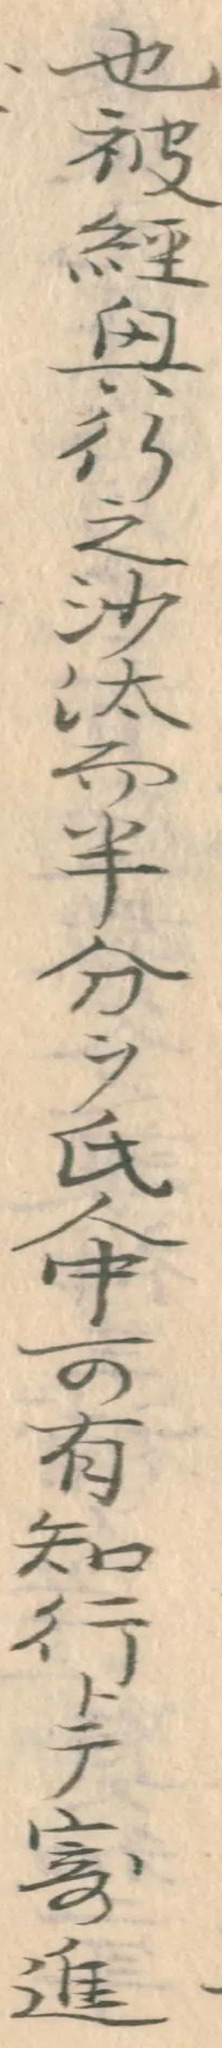也被経興行之沙汰而半分ヲ氏人中可有知行トテ寄進
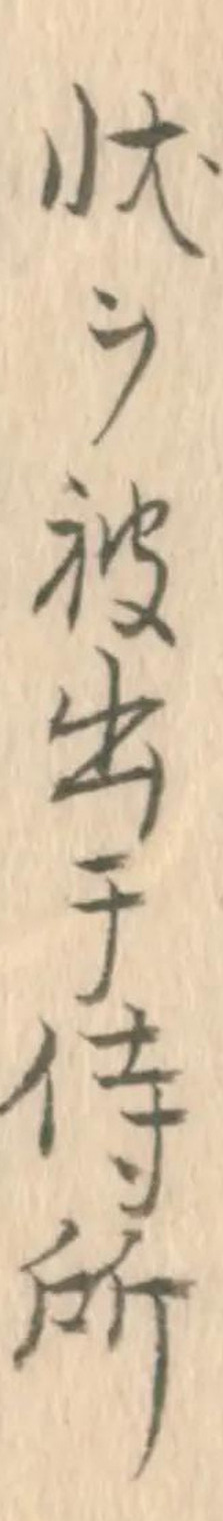状ヲ被出于侍所
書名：賀茂社記録. 第24冊
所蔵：国立国会図書館 National Diet Library, JAPAN
